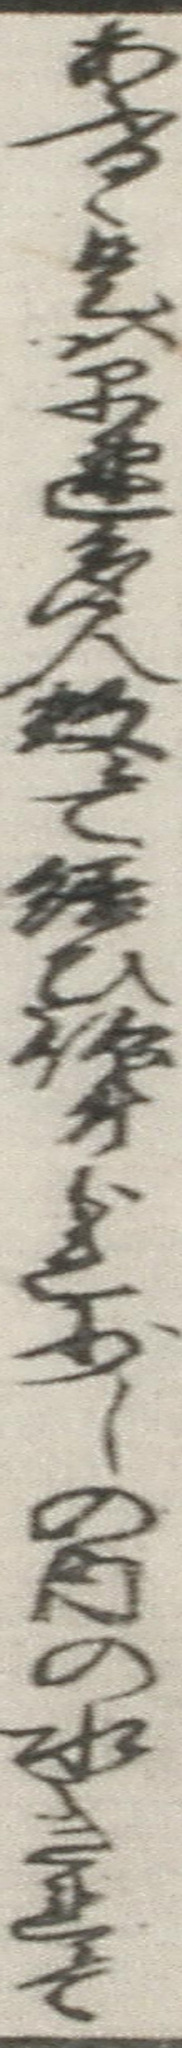あふるゝ是は早速多人数にて繕ひ仰付られ少しの内の水切れにて
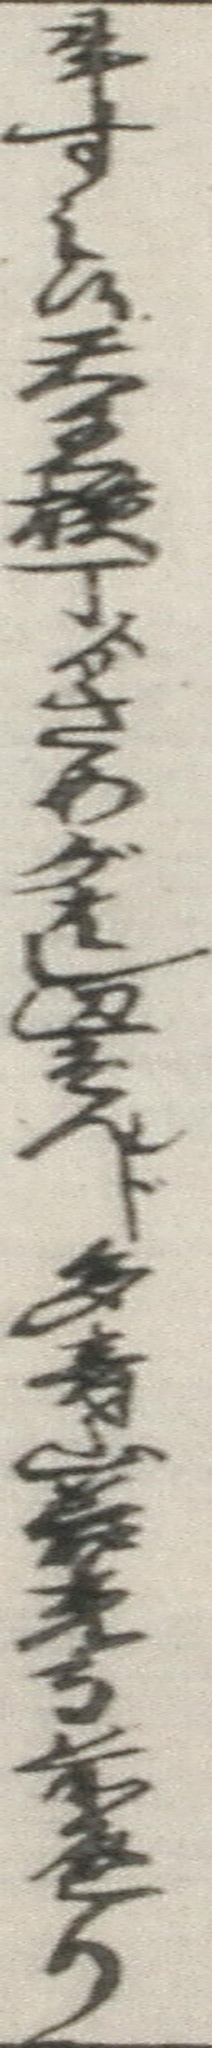事すみ候天王横丁ゟさめがはし辺そんじ多青山善光寺前通り
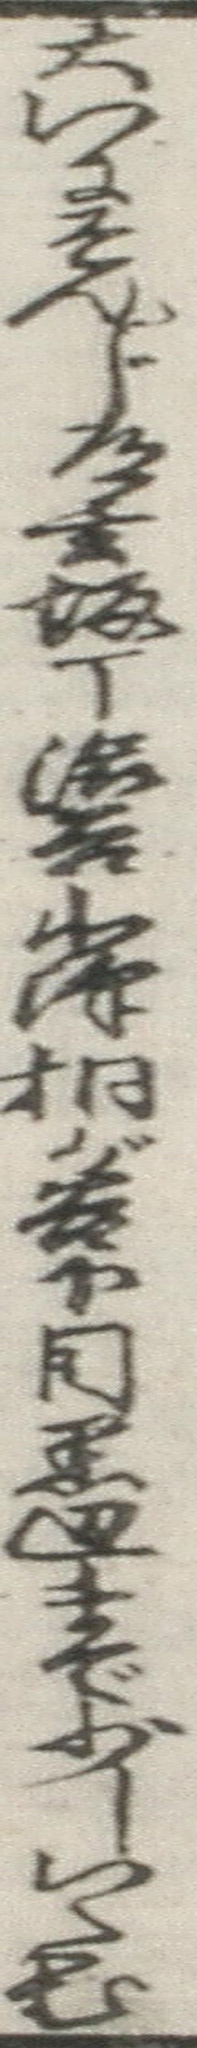大いにそんじ道玄坂丁渋谷北沢相が谷目黒辺まで少しいたむ
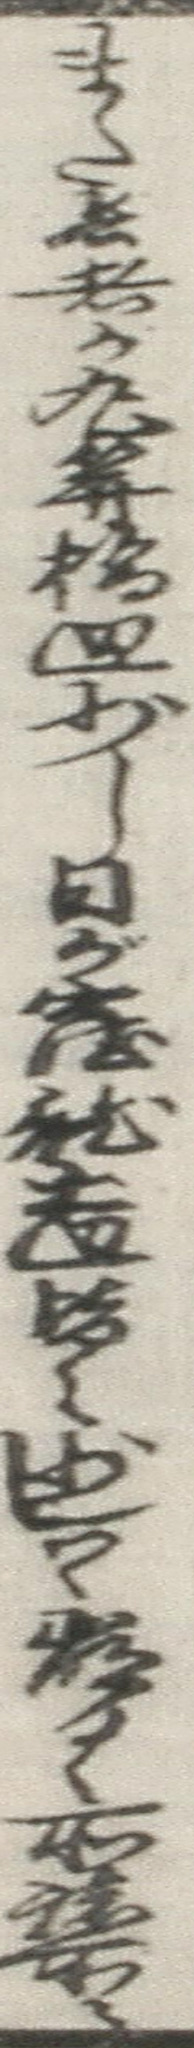また長者か丸笄橋辺少し日が窪龍土辺皆〻少しツヽ崩るゝ所諸所に
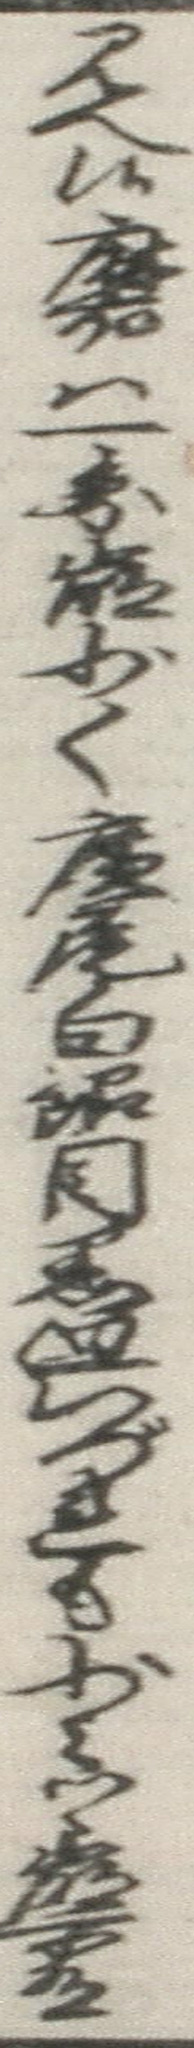見へ候麻布は一円崩少く廣尾白銀目黒但いづれも少〻ツヽ崩所有
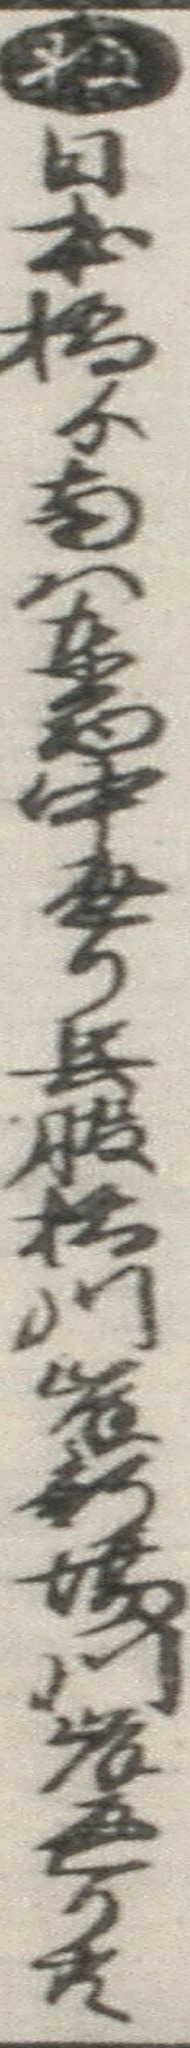ね日本橋ゟ南は東西中通り呉服橋川岸新場川岸通り共
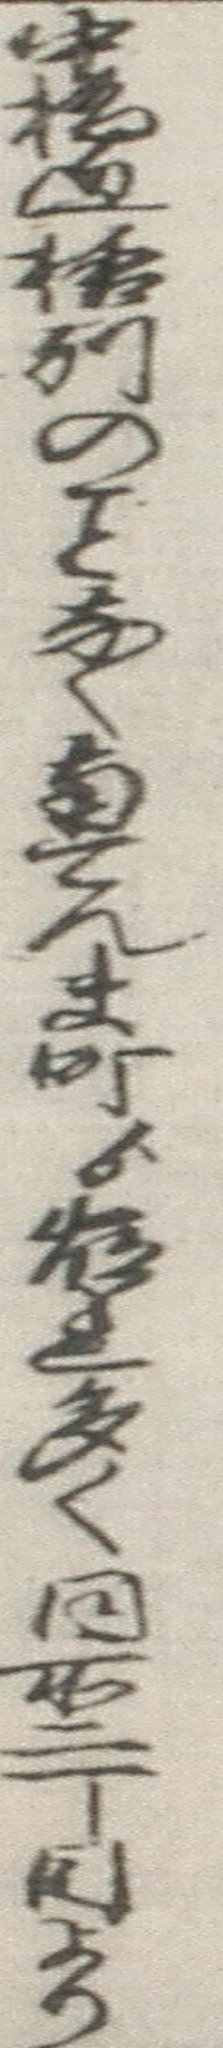中橋辺格別のことなく南てんま町ゟ崩れ多く同所二丁目より
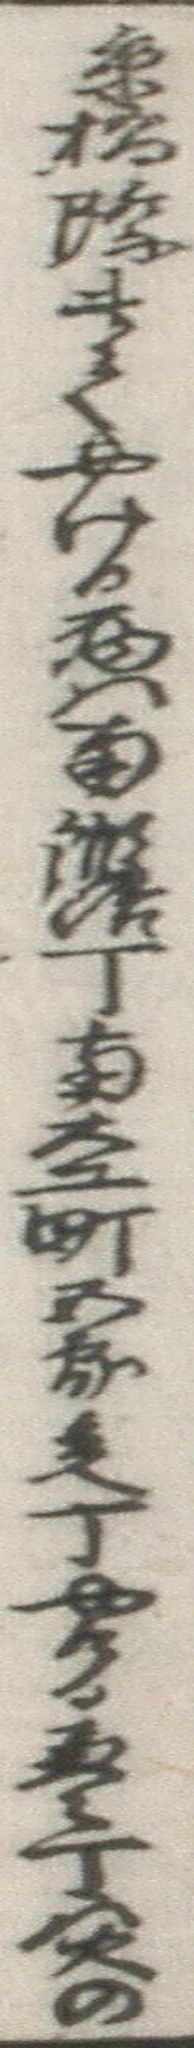京橋際まてやける西は南鍛冶丁南大工町五郎兵へ丁やける畳丁は火の
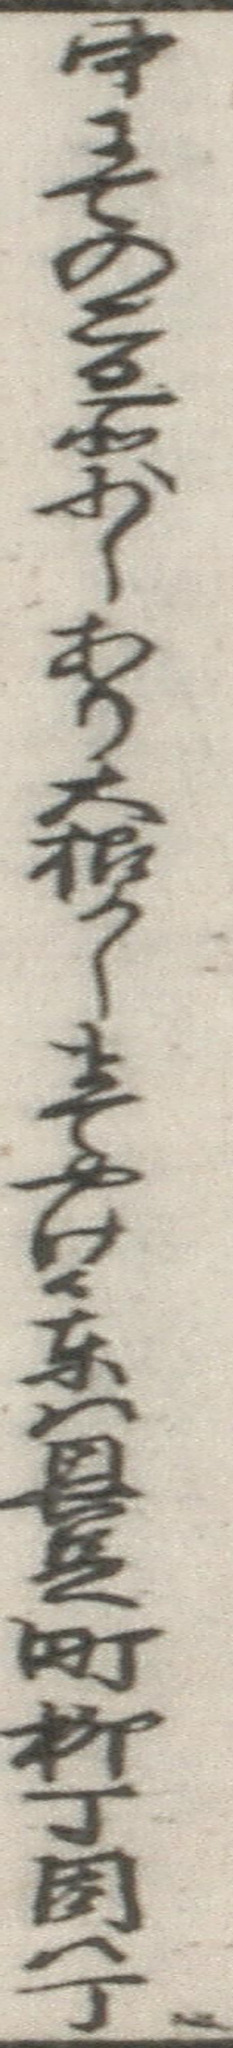中にてのこる所少しあり大根かしまてやける東は具足町柳丁因は丁
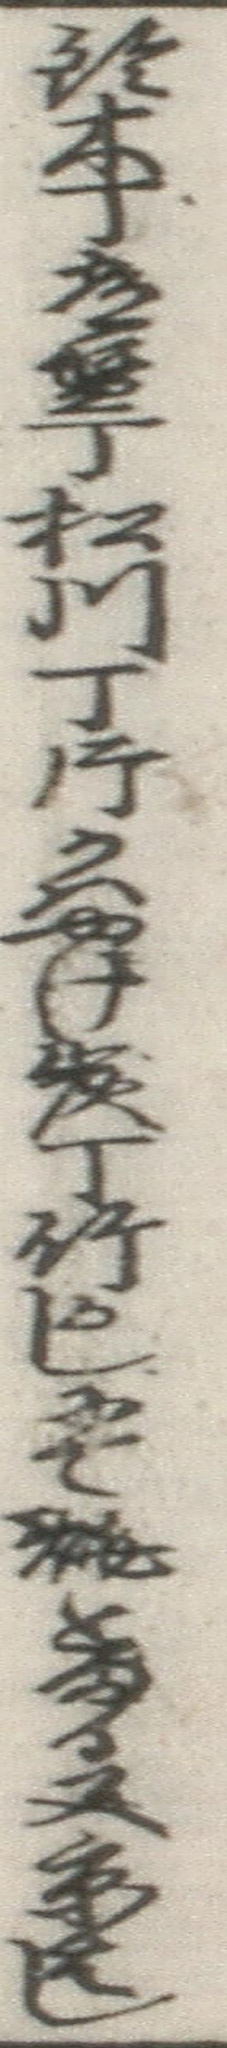鈴木丁常盤丁松川丁片かはやけ炭丁竹かしにて焼とまる又京はし
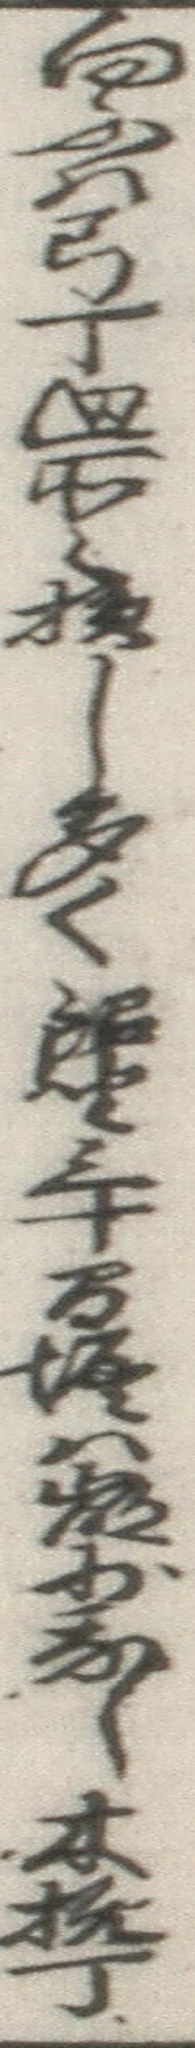向ふは弓丁辺所〻損し多く銀座三十間堀は崩少なし木挽丁
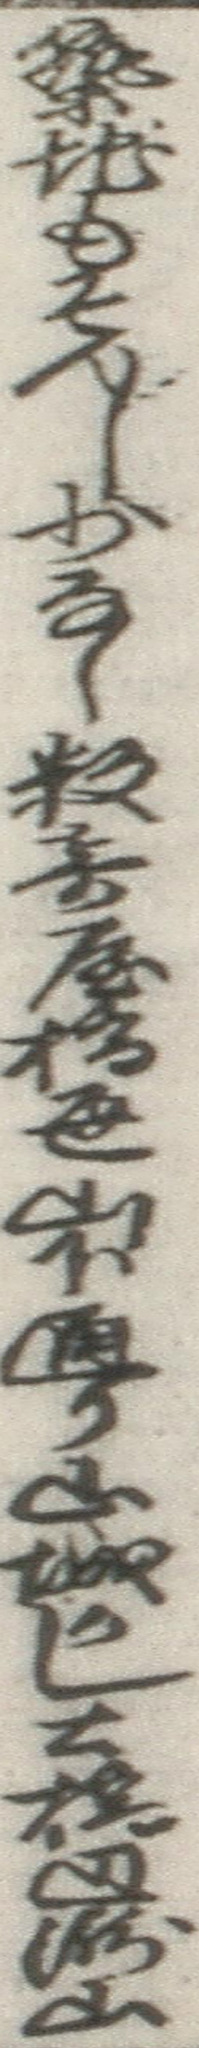築地もそんじ少なし数寄屋橋通山下通り山城かし土橋辺瀧山
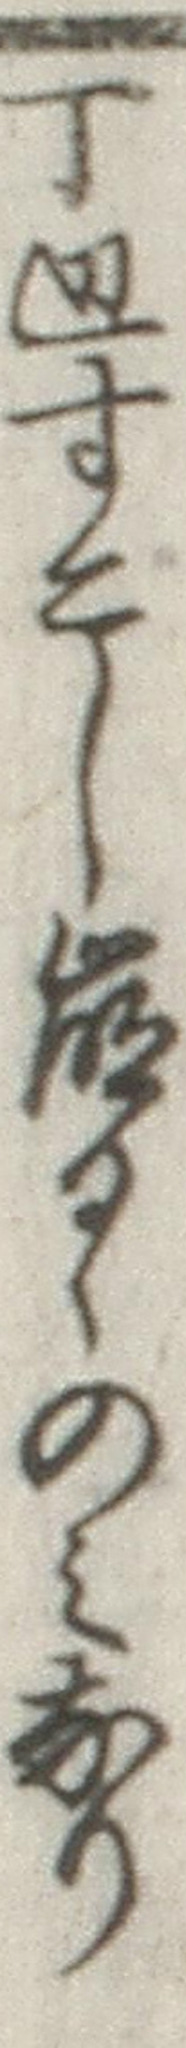丁辺すこし崩るゝのみなり
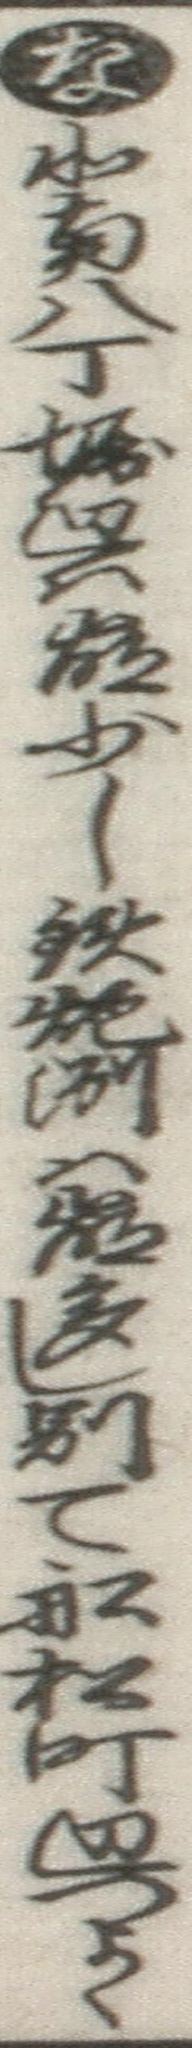な北南八丁堀辺は崩少し鉄砲洲は崩多し別て船松町辺つよく
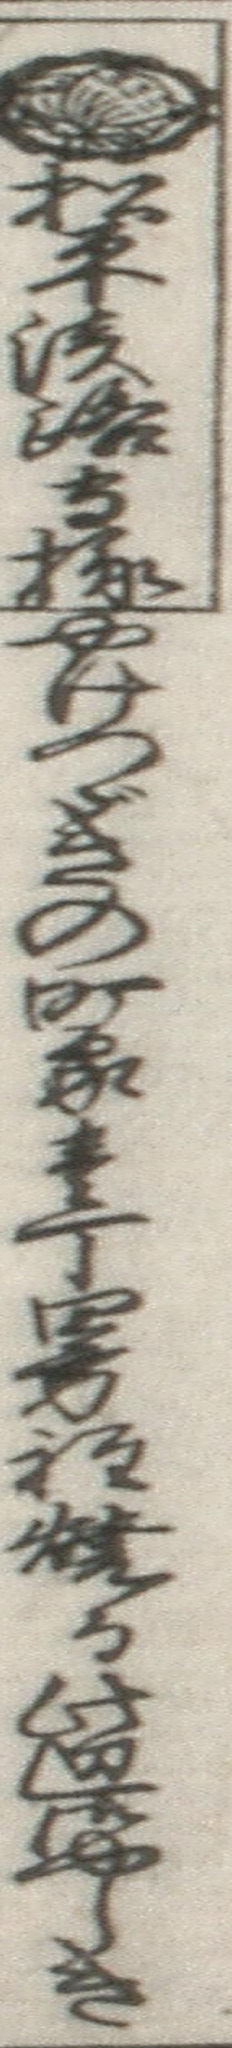松平淡路守様やけつぎの町家壱丁四方程焼る此辺御やしき
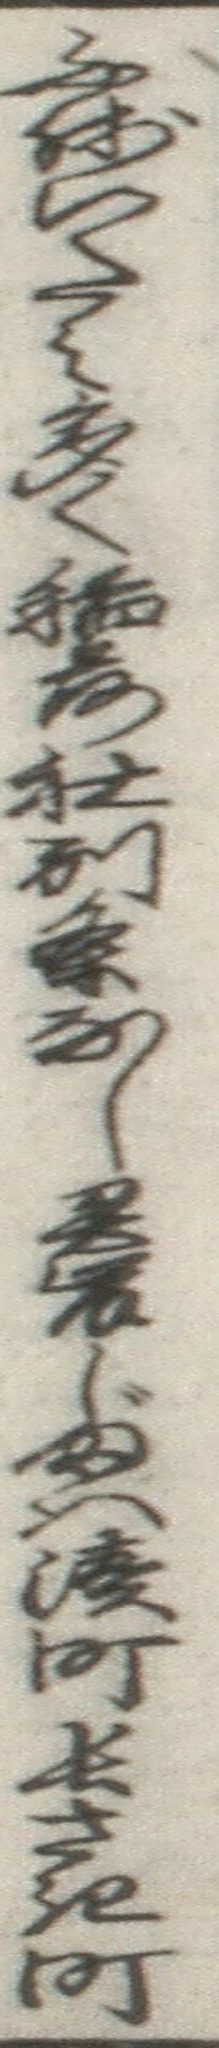不残いたみ多く稲荷社別条なし霊岸じまは湊町長さき町
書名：大地震焼場細見記
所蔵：東京大学地震研究所図書室 Earthquake Research Institute Library, The University of Tokyo, JAPAN
